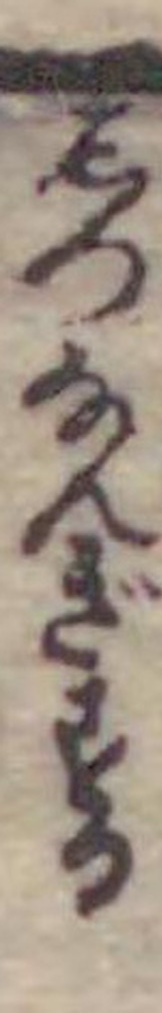しつなんぎする
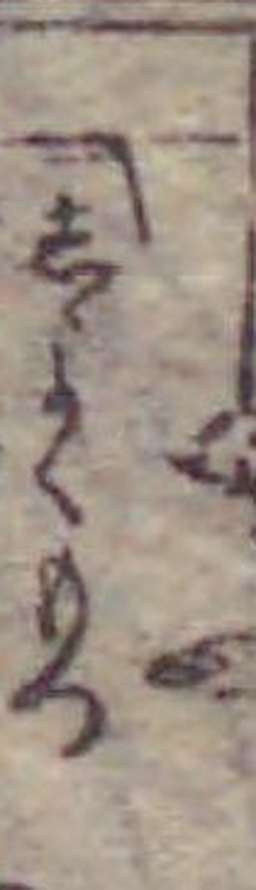〽しよくもつ
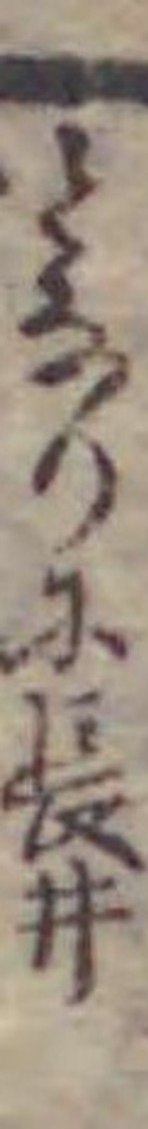となりに長井
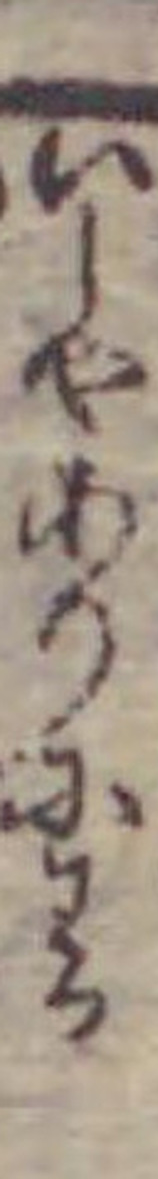いしやありにわか
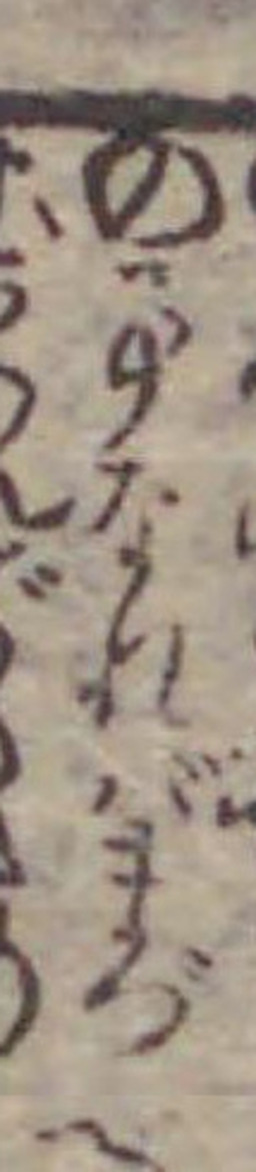の事なればまづ
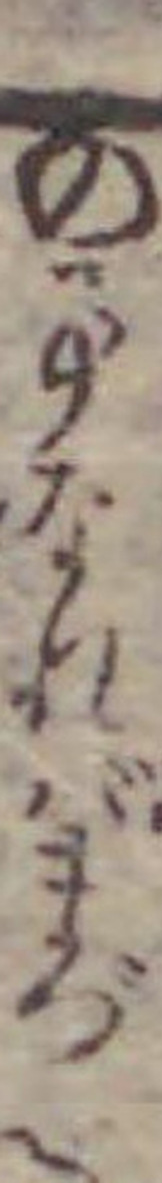の事なればまづ
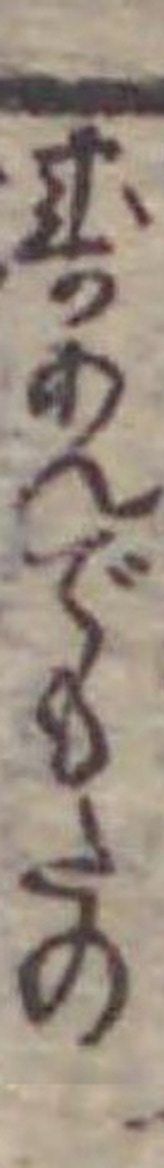寿あんでもたの
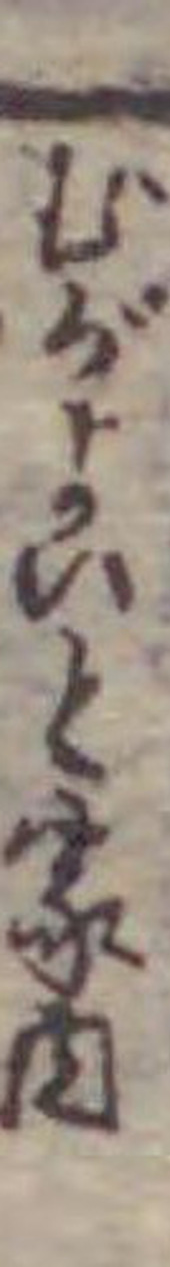むがよいと家内
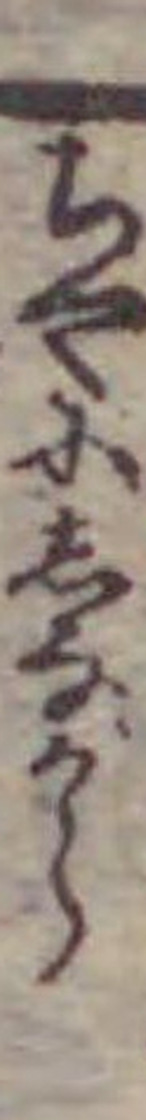ちやにしなから
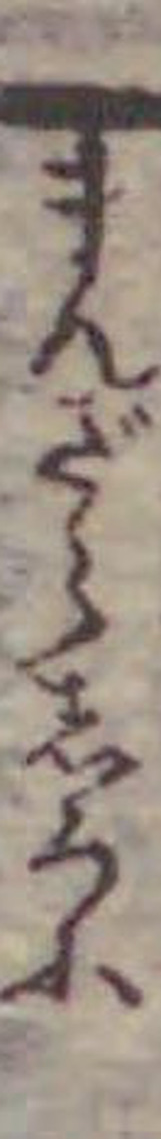まんざらしろふ
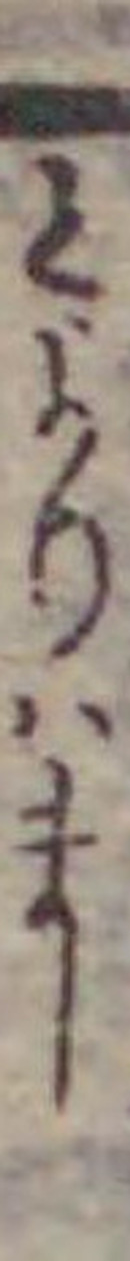とよりはまし
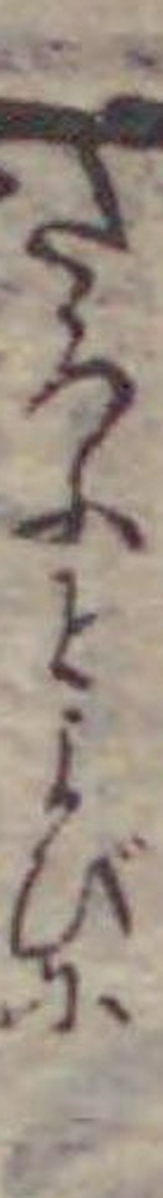たろふとよびに
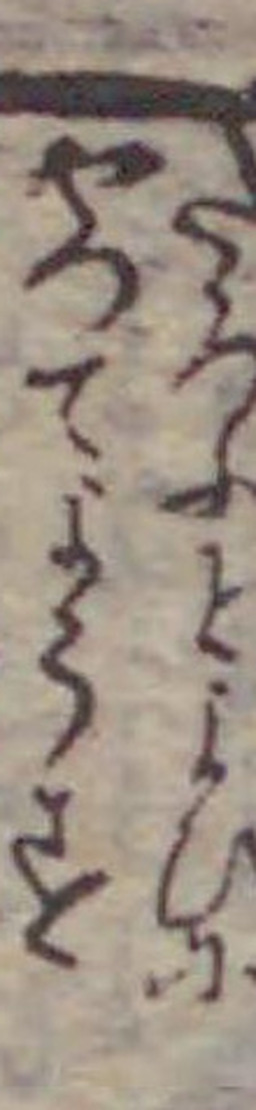やつてようす
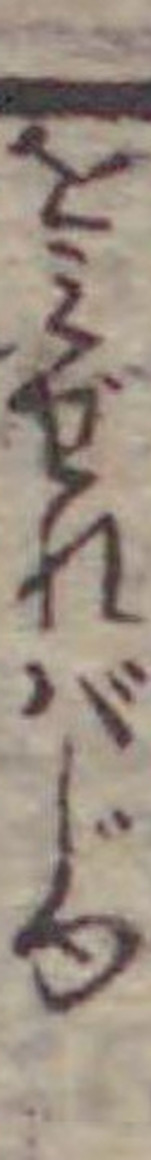をみせればじゆ
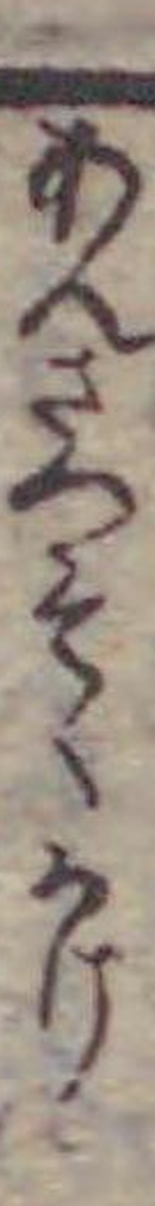あんさつそくかけ
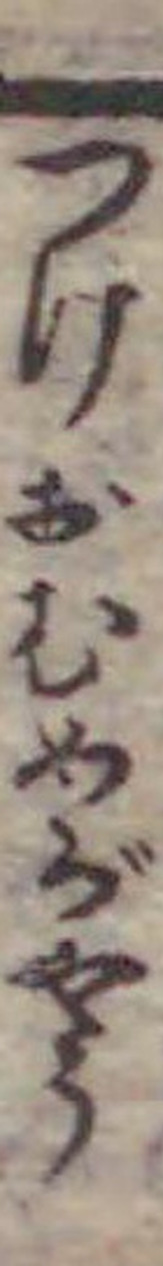つけおむめがやう
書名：鼻下長生薬 : 3巻
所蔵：国立国会図書館 National Diet Library, JAPAN
